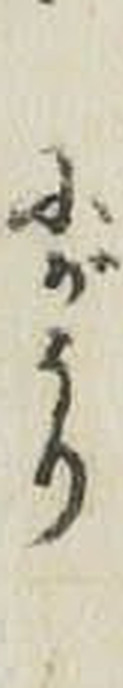にがうり
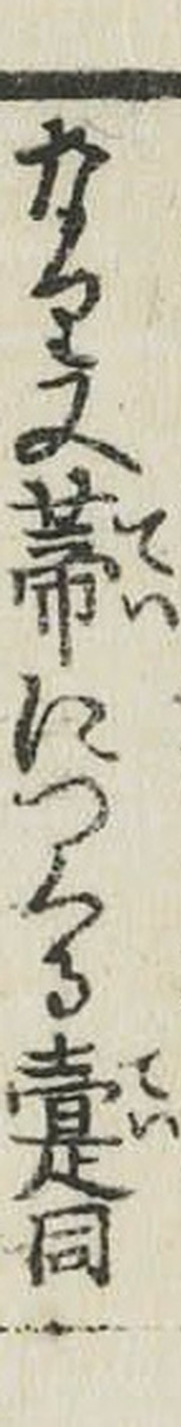なり又蒂につくる㚄同
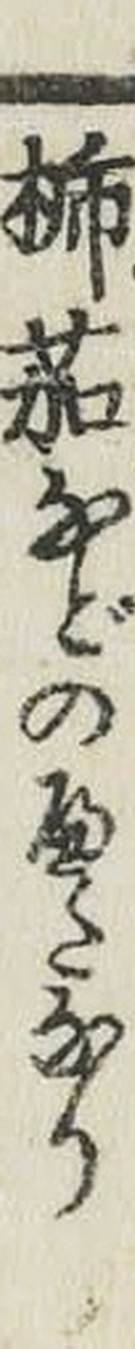柿茄などのへたなり
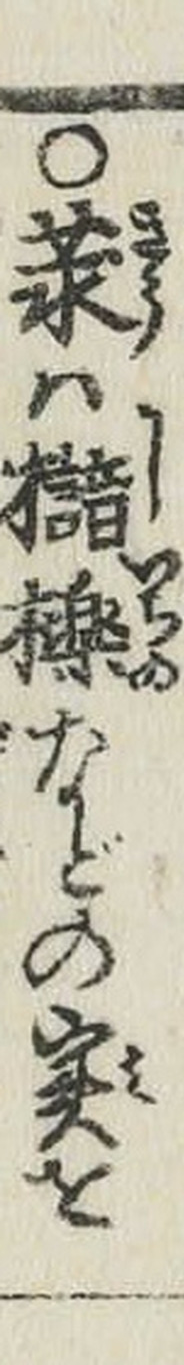○莍は櫧櫟などの実を
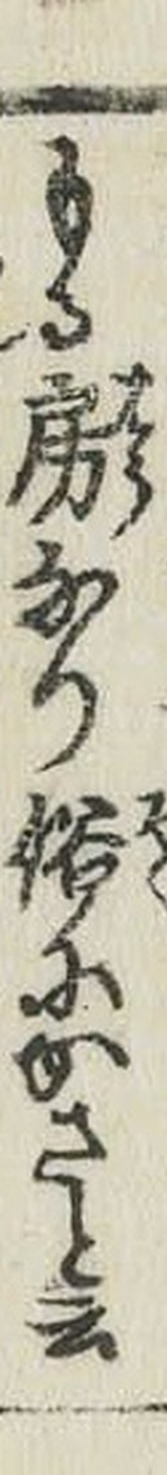もる房なり俗にかさと云
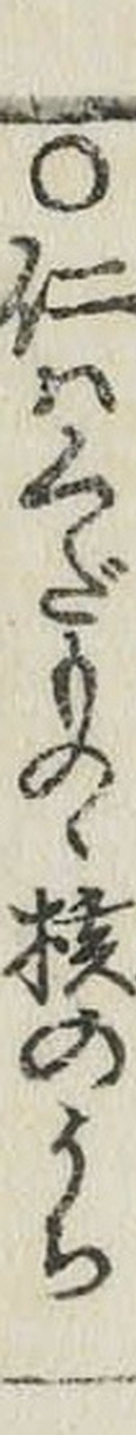○仁はくだものゝ核のうち
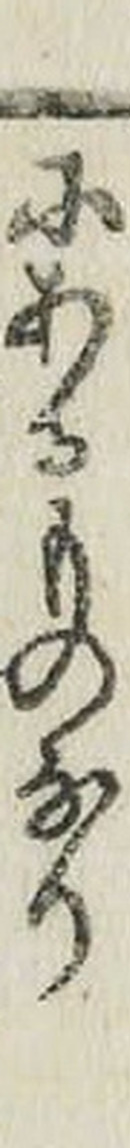にあるものなり
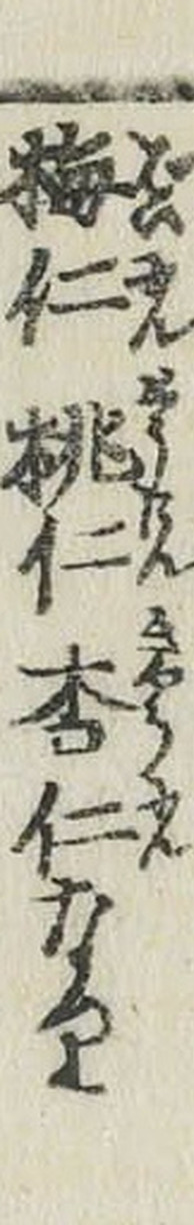梅仁桃仁杏仁なり
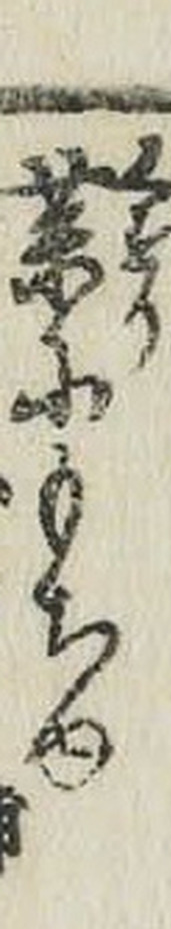薬にもちゆ
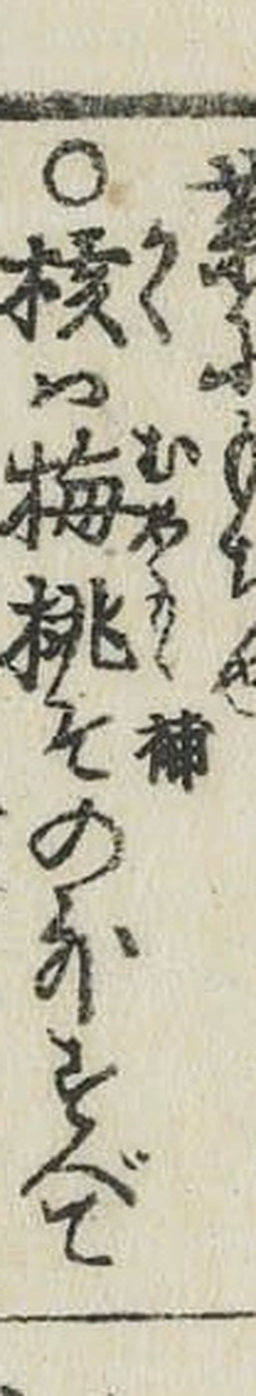○核は梅桃補その身すべて
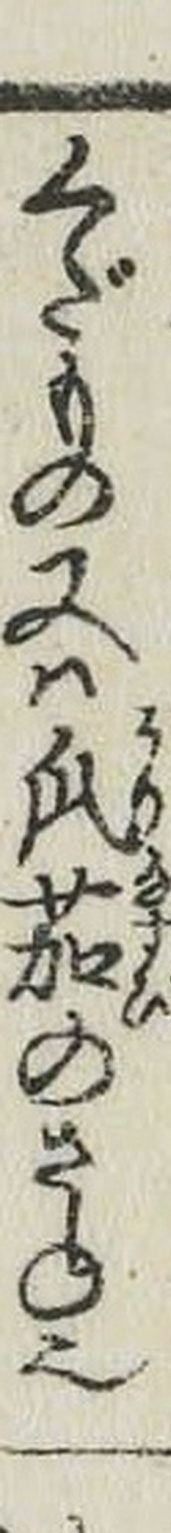くだもの又は瓜茄のさね也
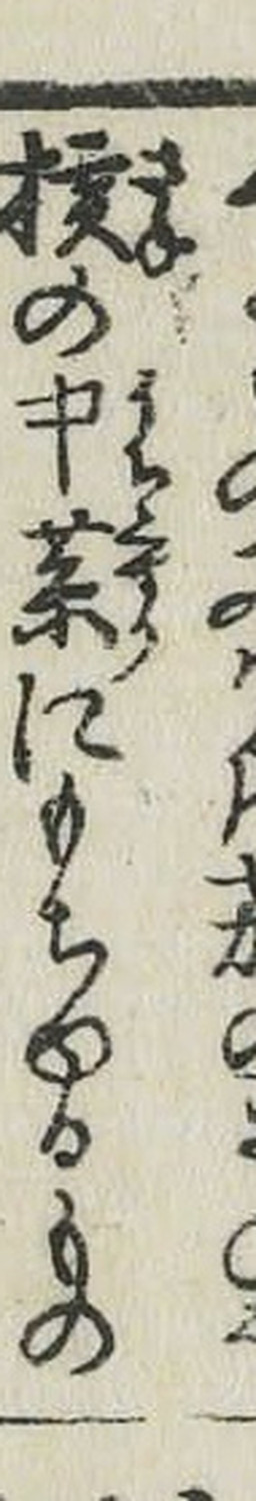核の中薬にもちゆるもの
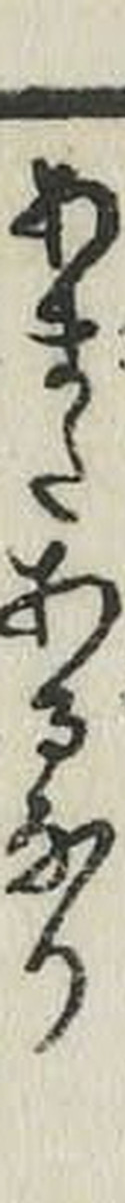あまたあるなり
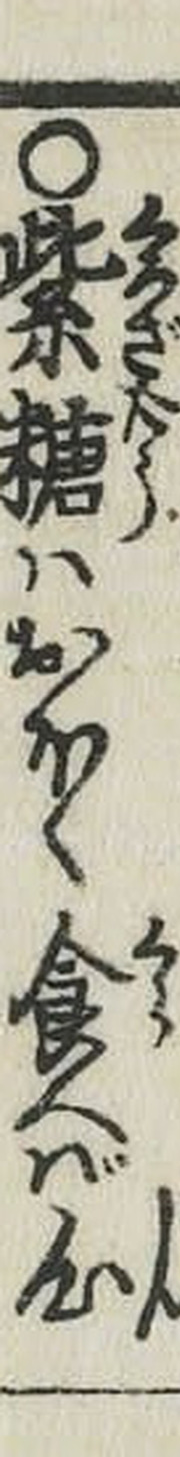○紫糖はおほく食へば心
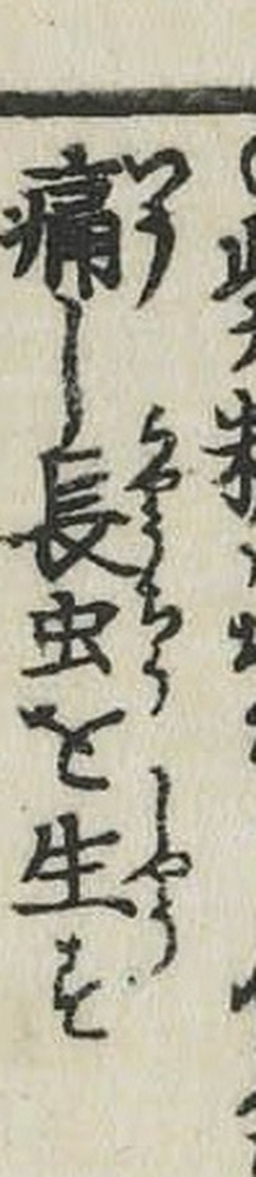痛し長虫を生す

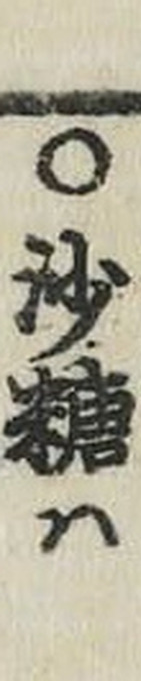○沙糖は
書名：増補頭書訓蒙図彙大成 10巻 8:巻之17-19
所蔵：東京学芸大学教育コンテンツアーカイブ
